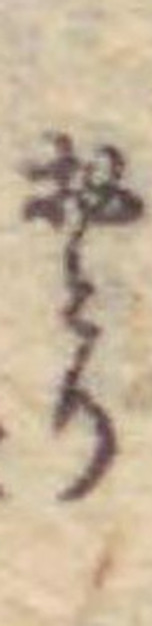おとり
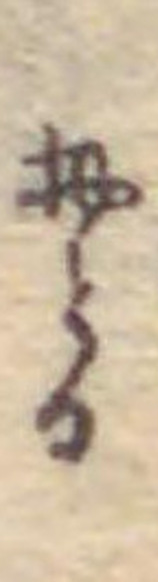おとる

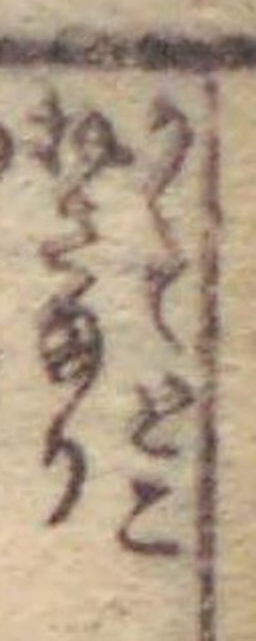おさまり
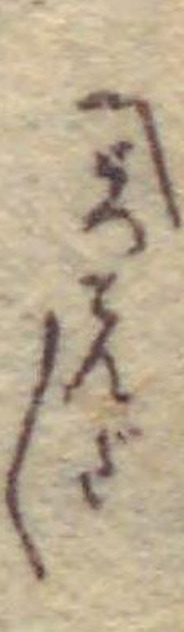〽がつてんだ
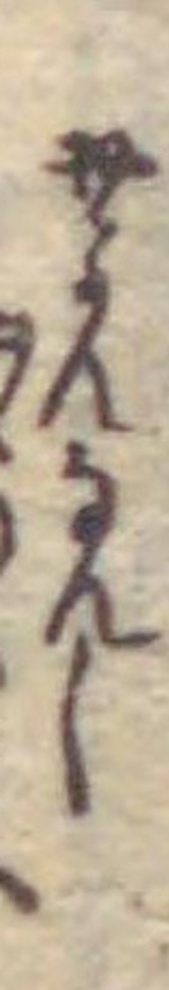およんなんし
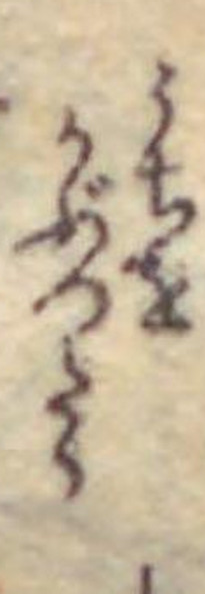かぶつたら
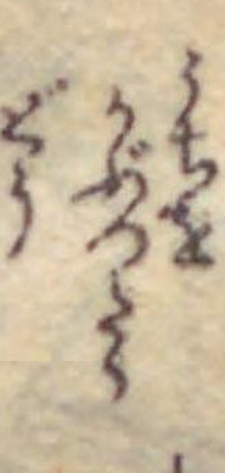かぶつたら
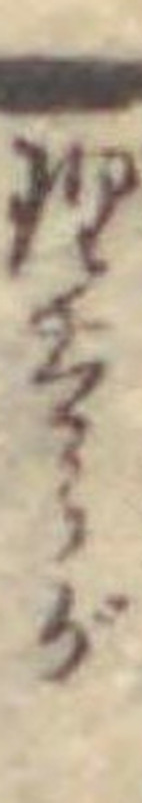理太郎が
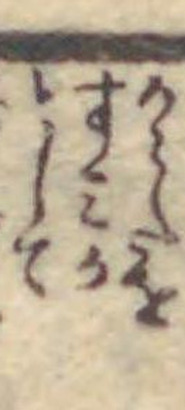すみか
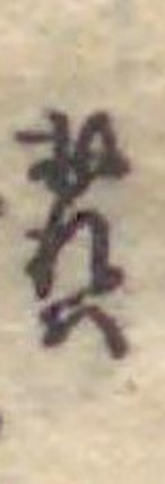おれは
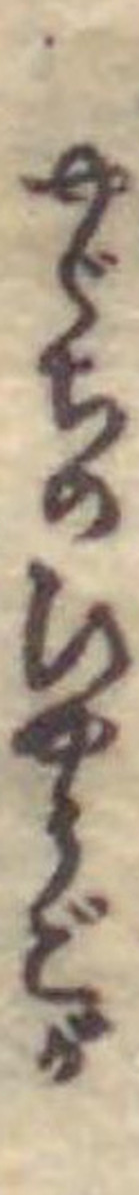やぐちのひやうごが
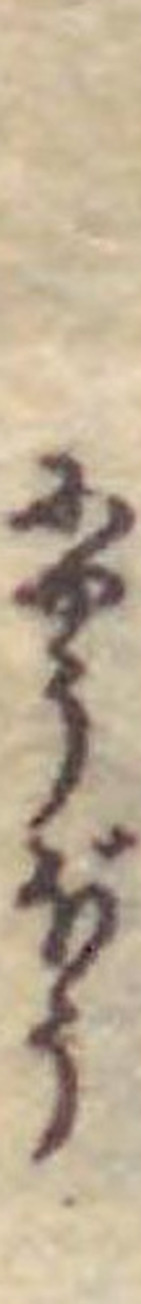にやうぼう
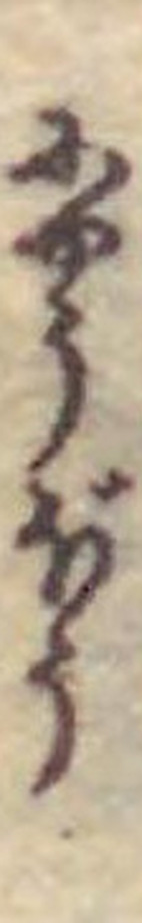にやうぼう
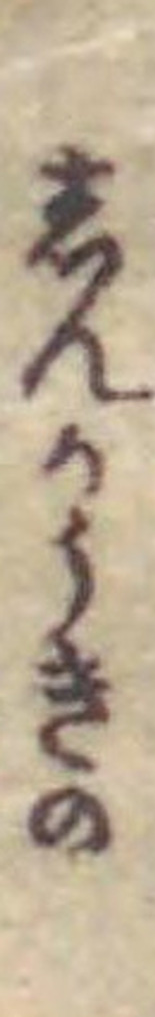しんかうきの
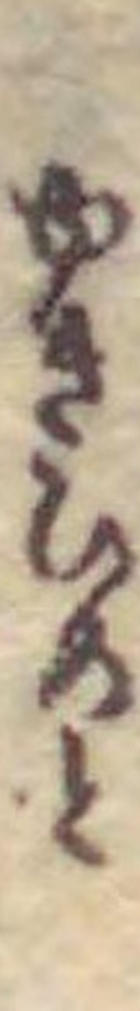やきひめと
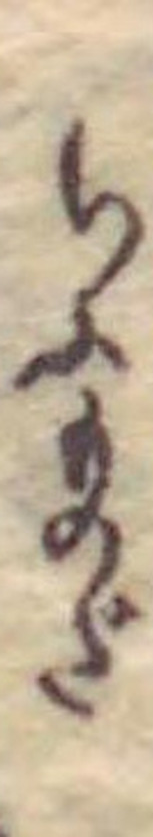いふものだ
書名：心学早染艸 : 3巻
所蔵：国立国会図書館 National Diet Library, JAPAN
